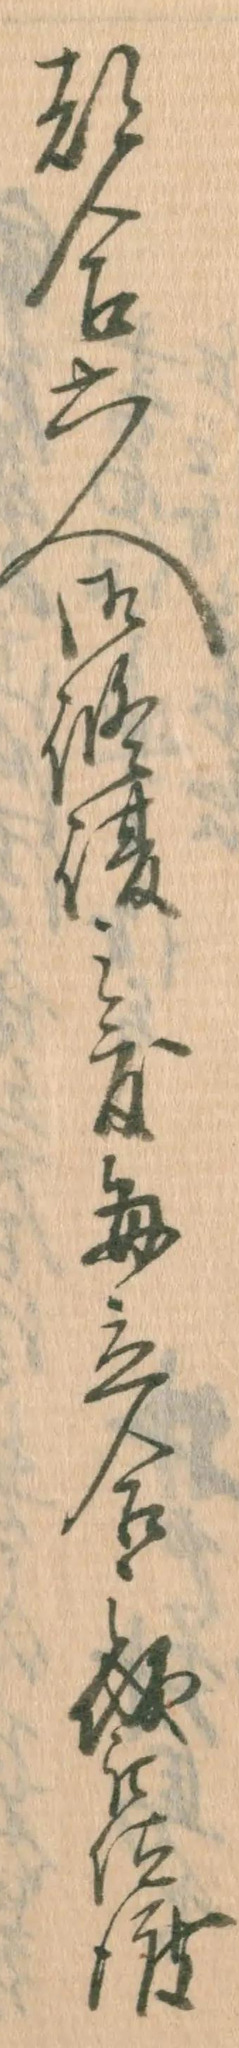都合六人御修復之度毎立合之儀被仰渡
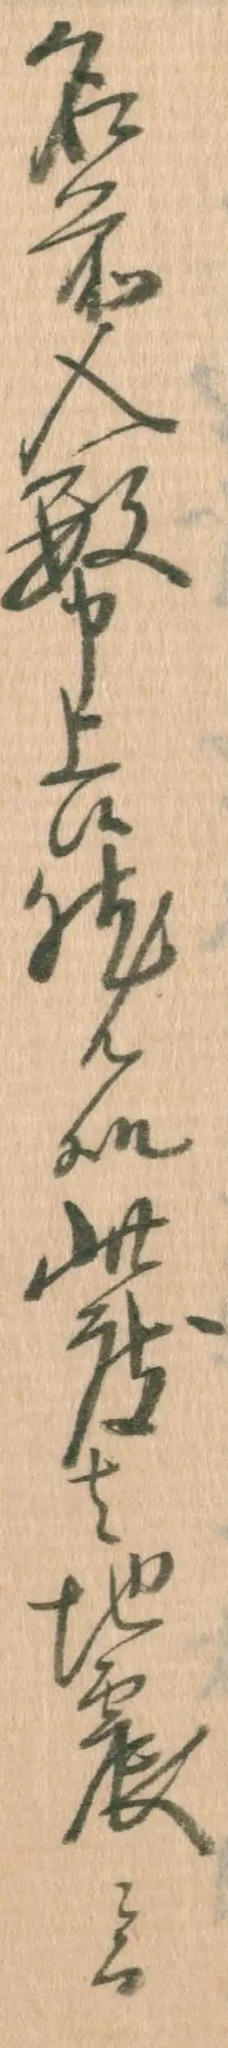名前人数申上候然ル処此度は地震ニて
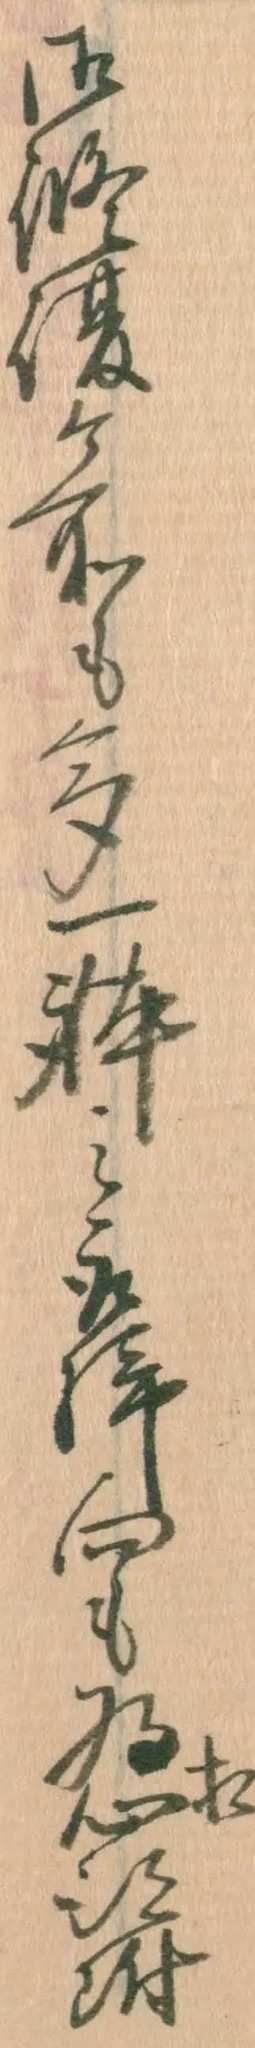御修復箇所も多一体之取締向きも為相心得附
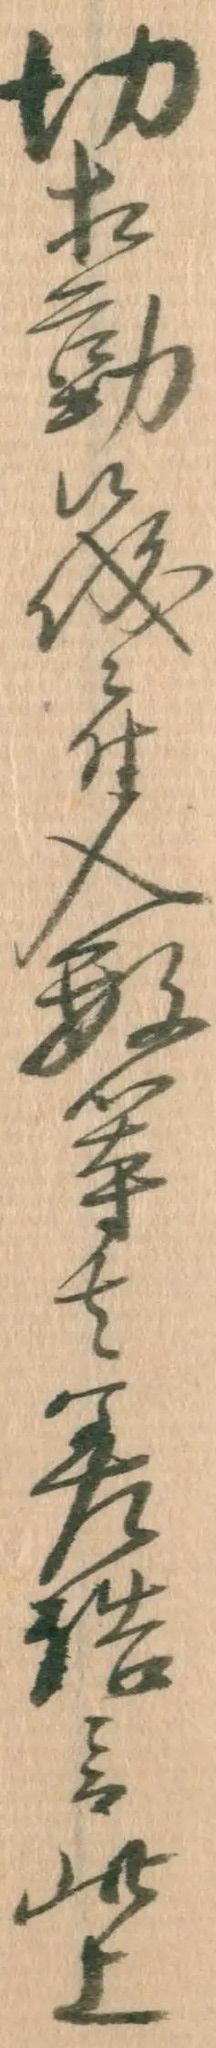切相勤候儀ニ付人数等は差詰ニて此上
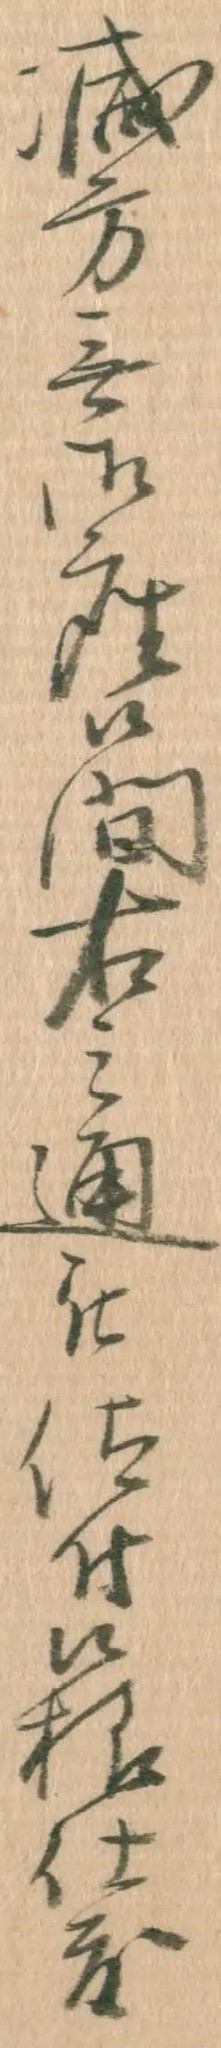減方無御座候間右之通被仰付候様仕度
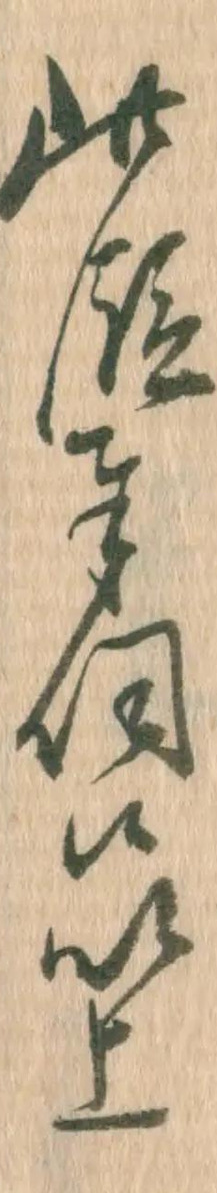此段奉伺候以上
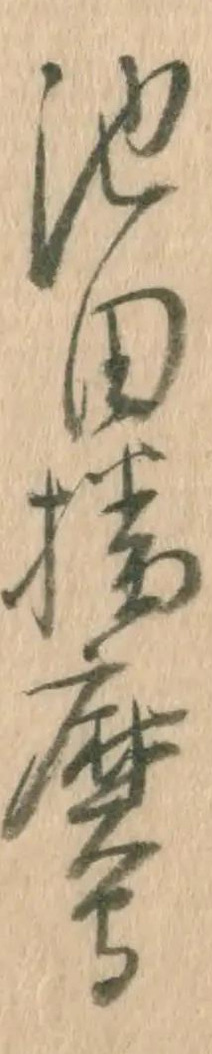池田播磨守

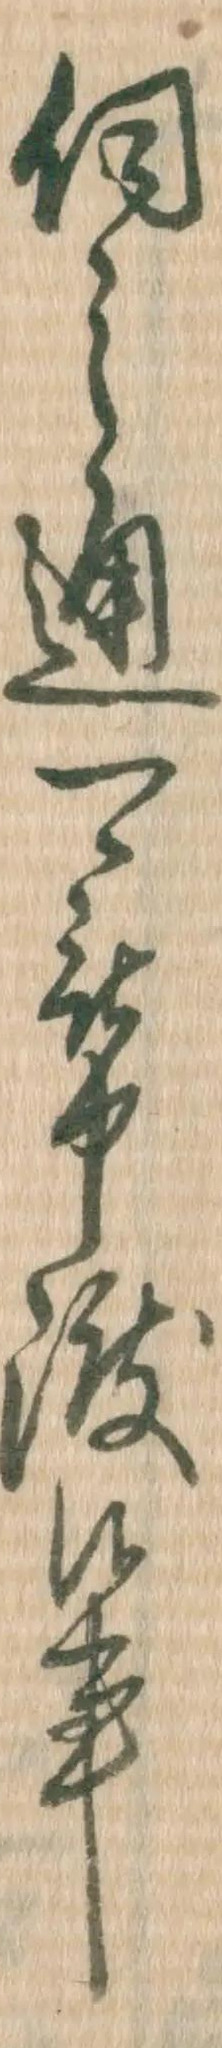伺之通可被申渡候事

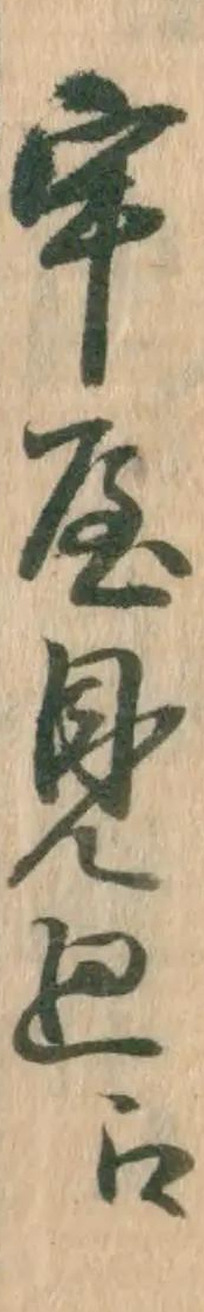│牢屋見廻え
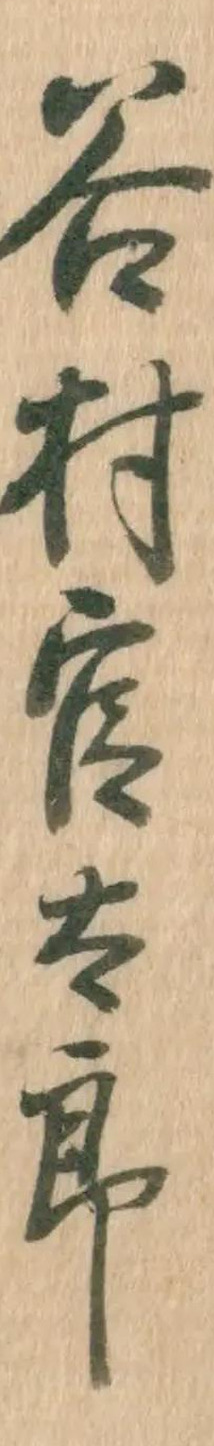谷村官太郎
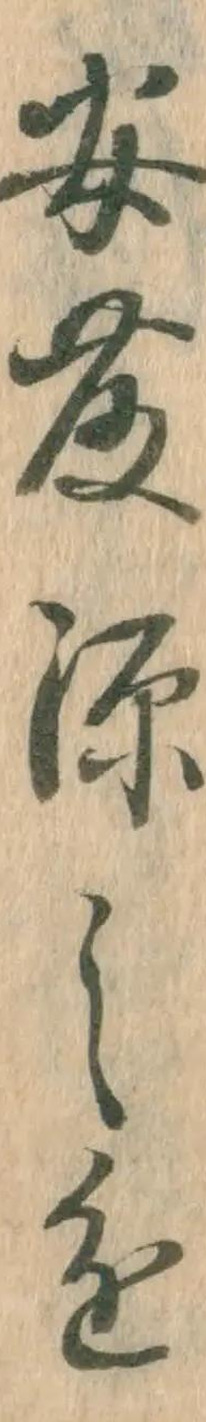安藤源之進
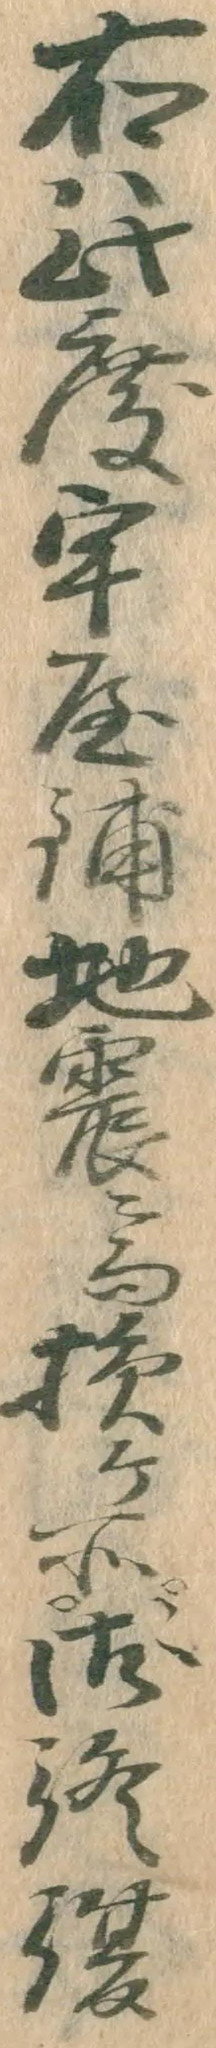右ハ此度牢屋鋪地震ニて損ケ所御修復

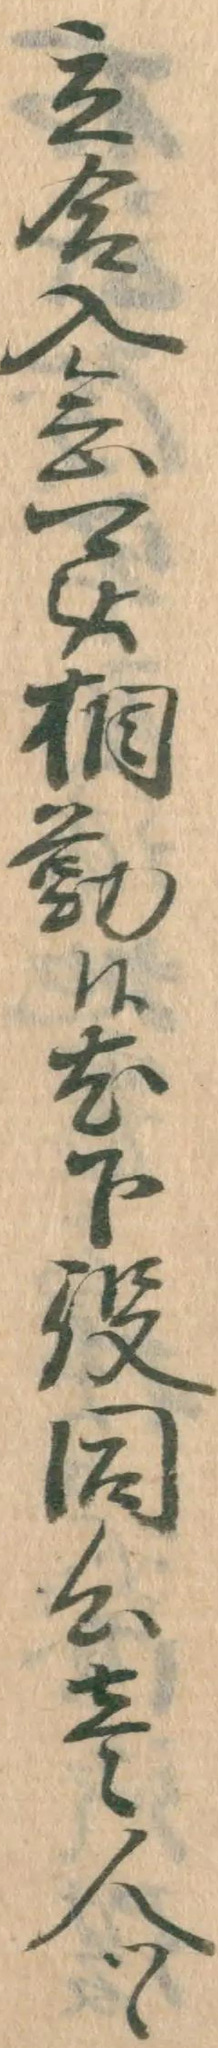立合入念可被相勤候尤下役同心壱人ツヽ
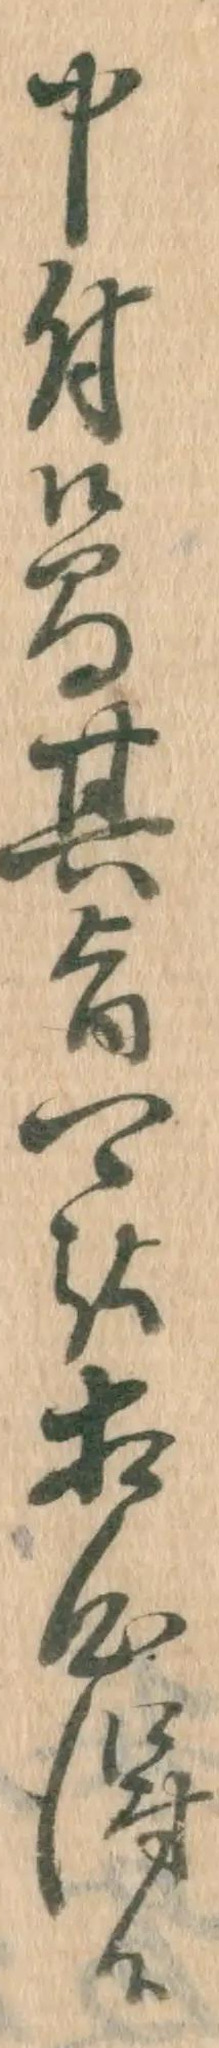申付候間其旨可被相心得候
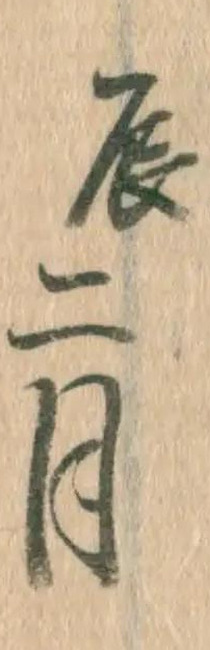辰二月
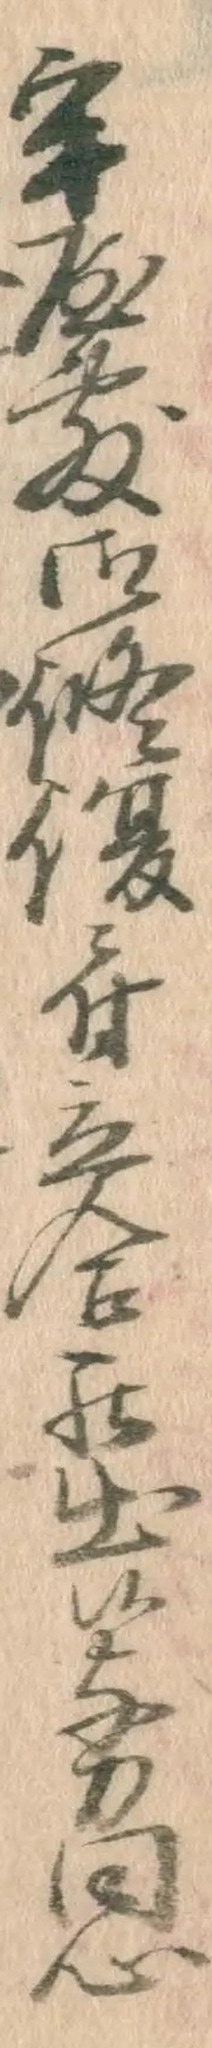牢屋敷御修復ニ付立合罷出候与力同心
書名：七十冊物類集 71巻. [44] 四十三 牢屋敷御普請御修覆地震ニ付骨折候牢屋掛御褒美之部
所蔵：国立国会図書館 National Diet Library, JAPAN
